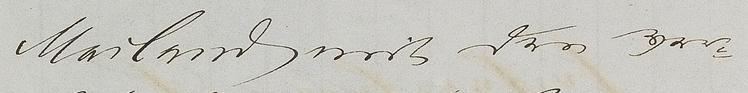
Mailand mit den ver-
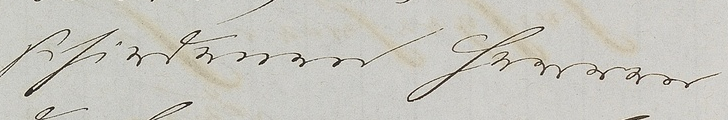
schiedenen Herren
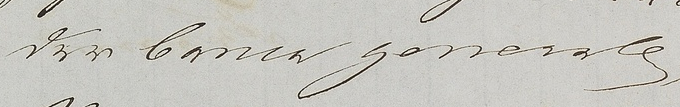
der banca generale,
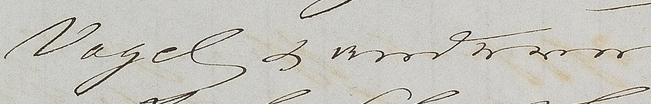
Vogel & andern
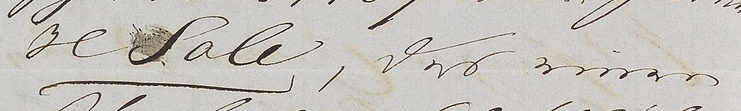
Il Sole , das einen
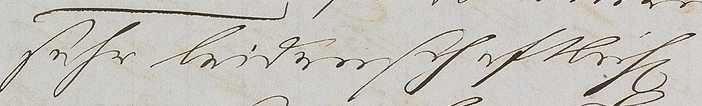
sehr leidenschaftlichen
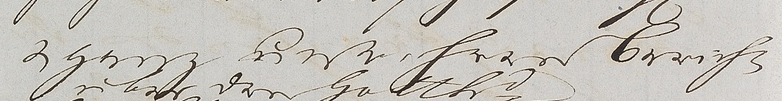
& ganz unwahren Bericht
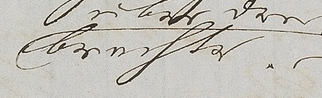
brachte. –
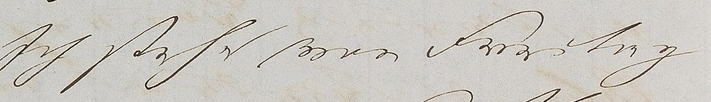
Ich stehe von Freitag
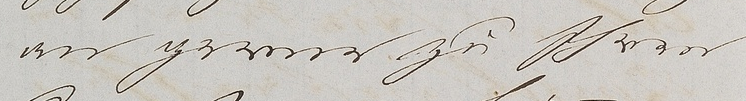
an gerne zu Ihren
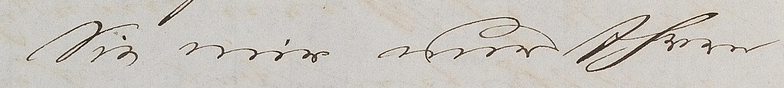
Sie mir nur Ihren
